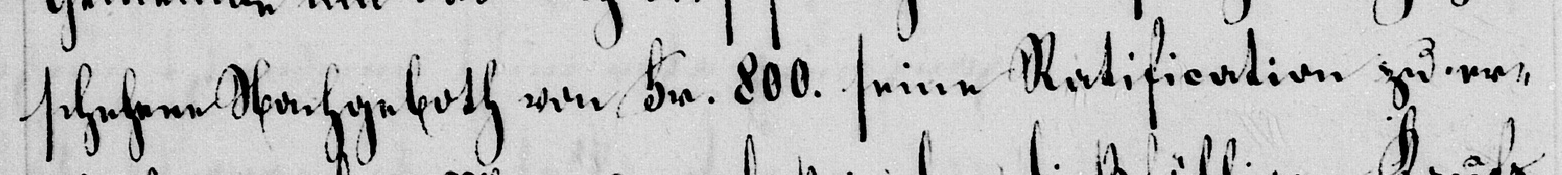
schehene Nachgeboth von Fr. 800. seine Ratification zu er¬
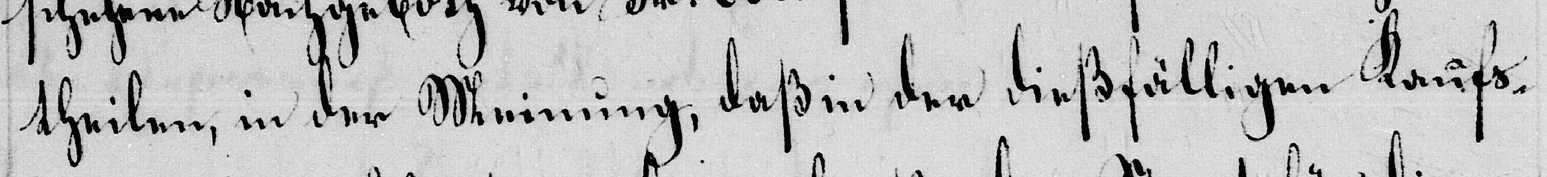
theilen, in der Meinung, daß in der dießfälligen Kaufs¬
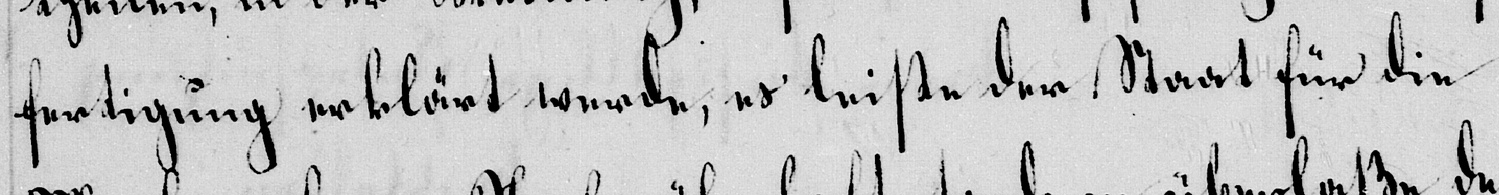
fertigung erklärt werde, es leiste der Staat für die
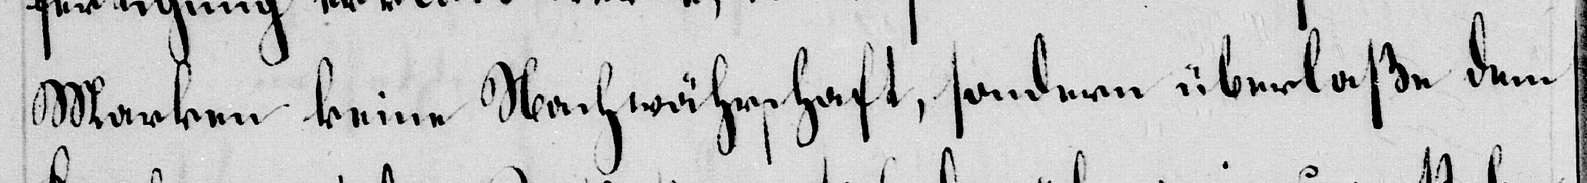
Marken keine Nachwährschaft, sondern überlaße dem
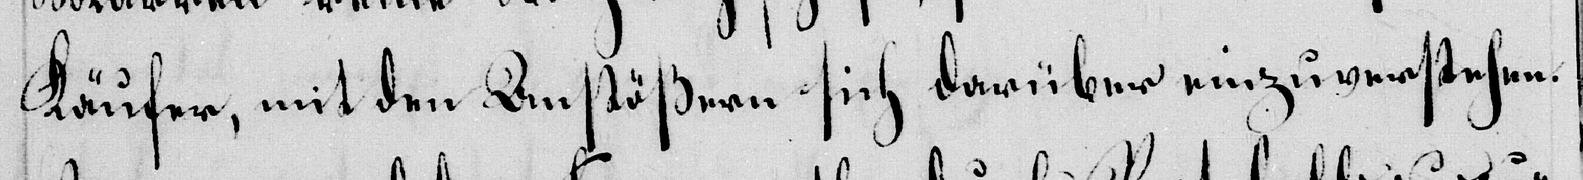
Käufer, mit den Anstößern sich darüber einzuverstehen.
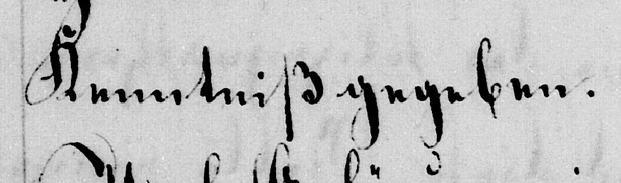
Kenntniß gegeben.
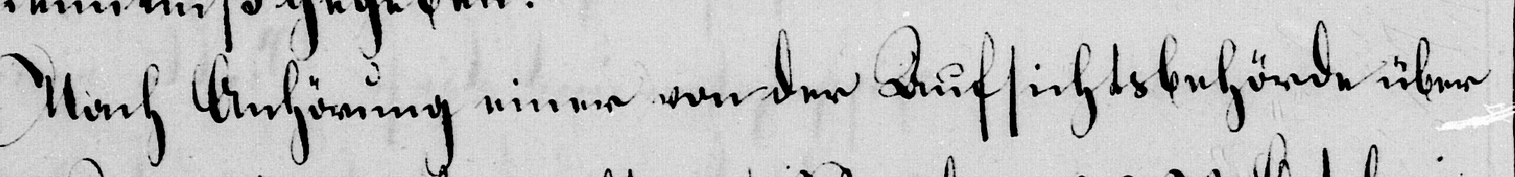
Nach Anhörung einer von der Aufsichtsbehörde über
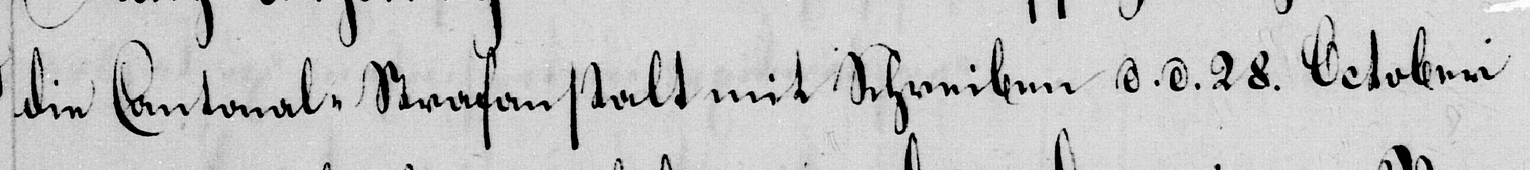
die Cantonal-Strafanstalt mit Schreiben d. d. 28. October
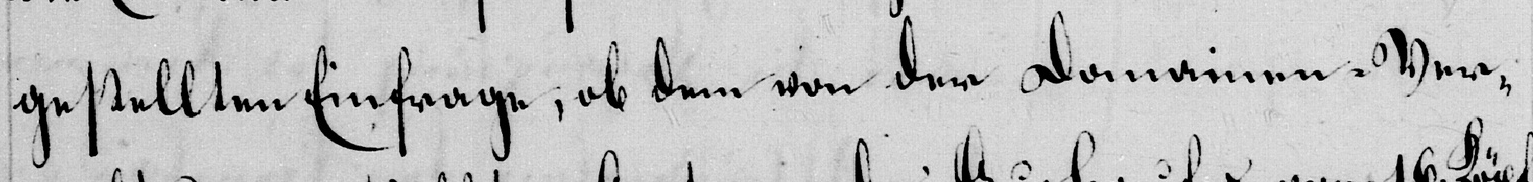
gestellten Einfrage, ob dem von der Domainen-Ver¬
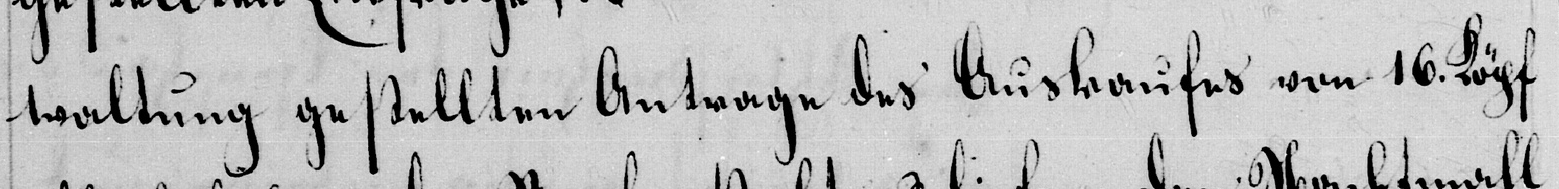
waltung gestellten Antrage des Auskaufes von 16. Köpf
